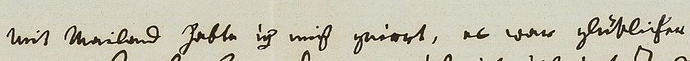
Mit Mailand hatte ich mich geirrt, es war glüklicher
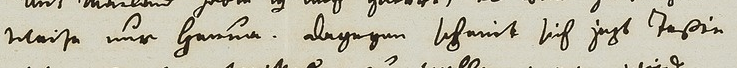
Weise nur Genua. Dagegen scheint sich jezt Tessin
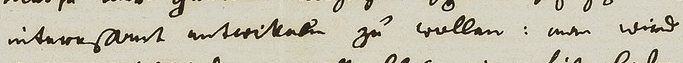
interessant entwikeln zu wollen: man wird
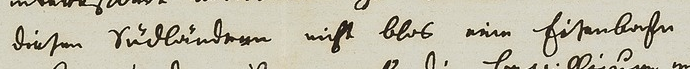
diesen Südländern nicht blos eine Eisenbahn
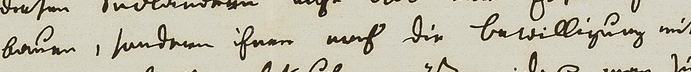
bauen, sondern ihnen noch die Bewilligung mit
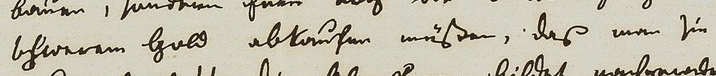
schwerem Gold abkaufen müßen; daß man sie
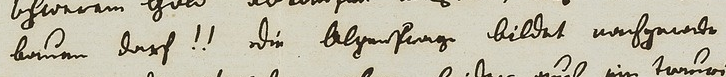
bauen darf!! Die Alpenfrage bildet nachgerade
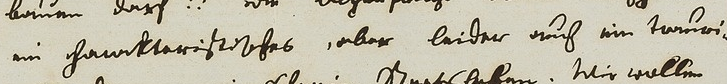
ein charakteristisches, aber leider auch ein trauri-
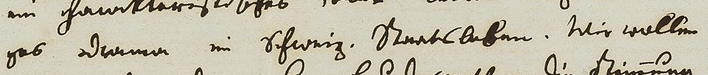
ges Drama im Schweiz. Staatsleben. Wir wollen
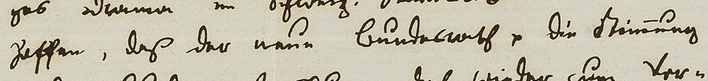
hoffen, daß der neue Bundesrath & die Stimmung
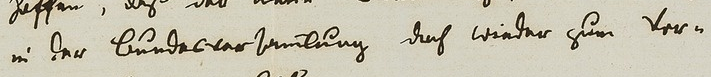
in der Bundesversammlung doch wieder zum Vor-
